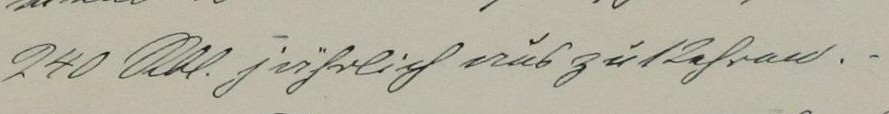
240 Rbl. jährlich auszukehren.
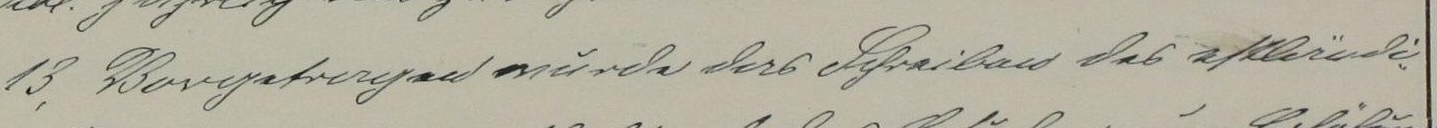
13. Vorgetragen wurde das Schreiben des estländi-
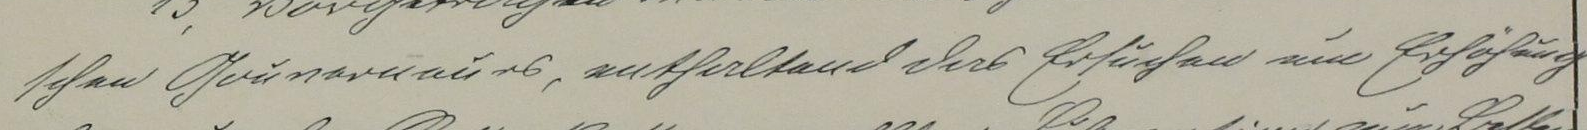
schen Gouverneurs, enthaltend das Ersuchen um Erhöhung
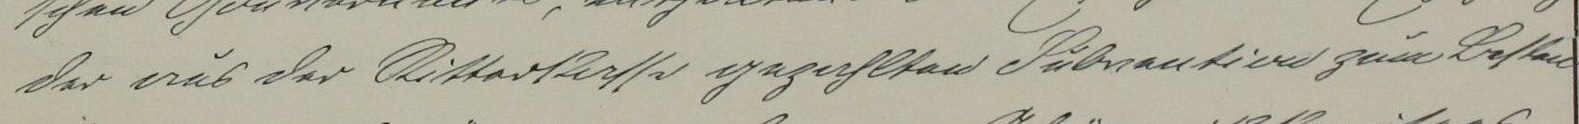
der aus der Ritterkasse gezahlten Subvention zum Besten
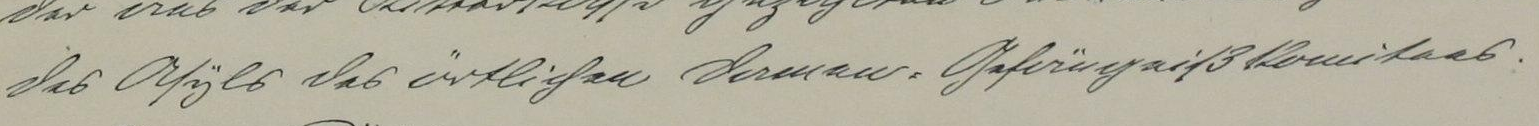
des Asyls des örtlichen Damen-Gefängnißkomitees.
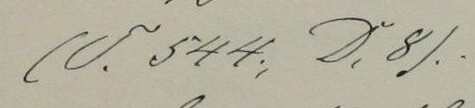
(T.544; D.8)
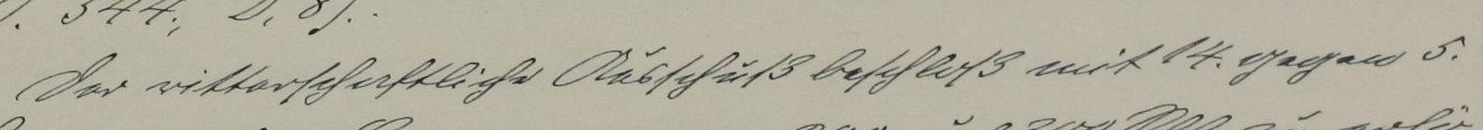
Der ritterschaftliche Ausschuß beschloß mit 14 gegen 5
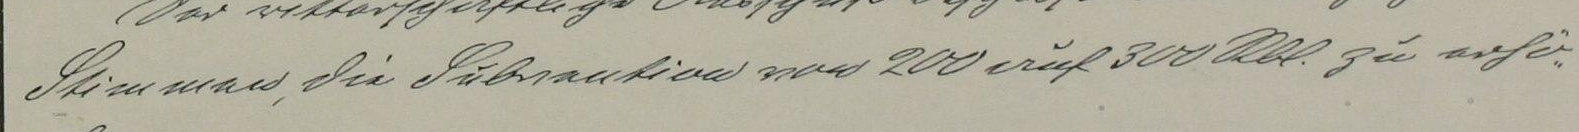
Stimmen, die Subvention von 200 auf 300 Rbl. zu erhö-
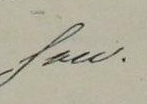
hen.
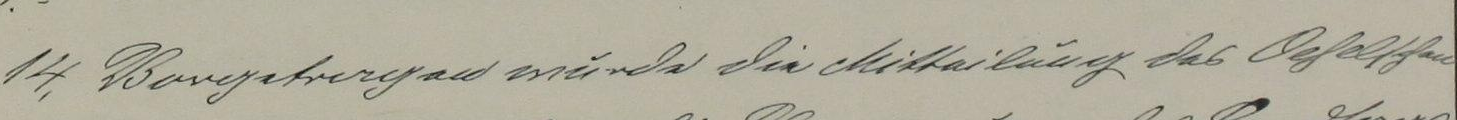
14. Vorgetragen wurde die Mitteilung des Oeselschen
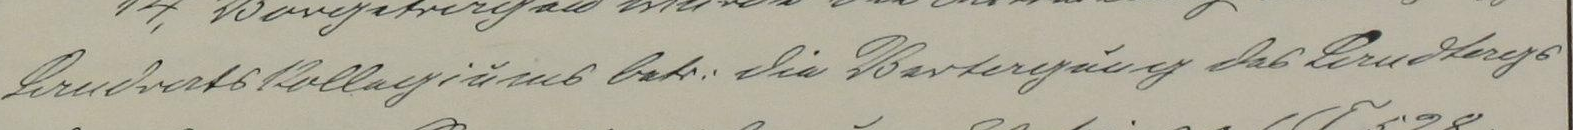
Landratskollegiums betr. die Vertagung des Landtags
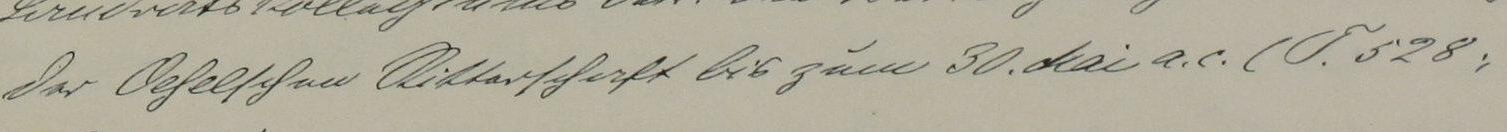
der Oeselschen Ritterschaft bis zum 30. Mai a.c. (T.528;
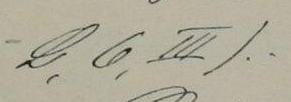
L.6,III).
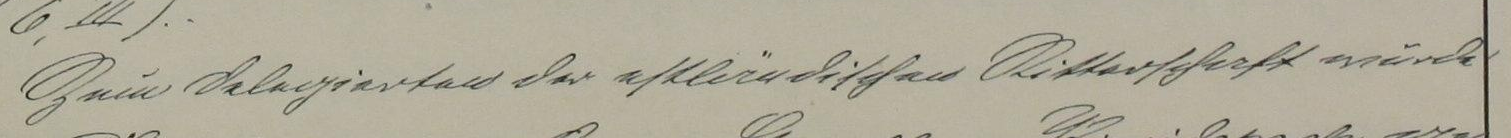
Zum Delegierten der estländischen Ritterschaft wurde
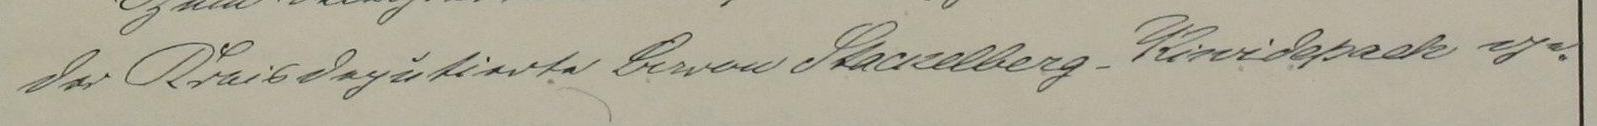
der Kreisdeputierte Baron Stackelberg-Kiwidepaeh ge-
